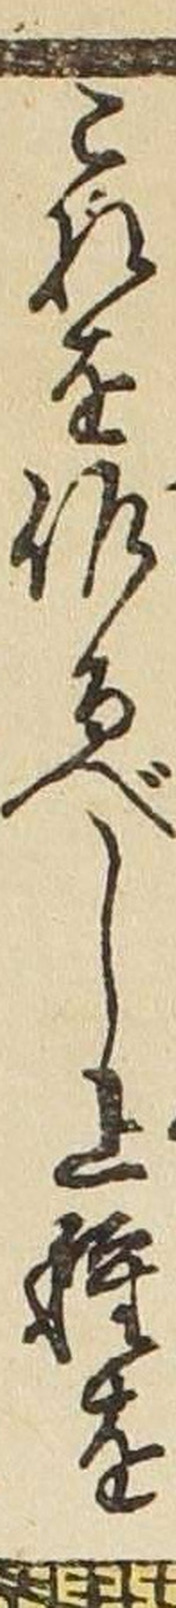これを作るべし上種を
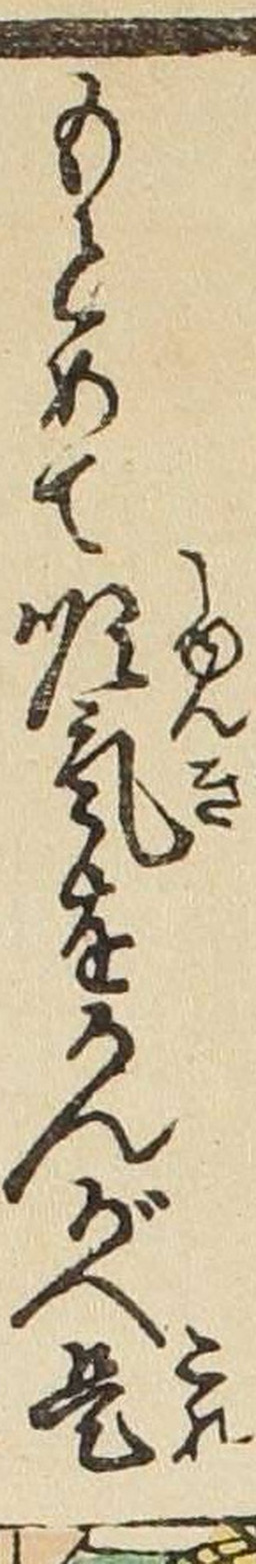もとめて順気をかんがへ是
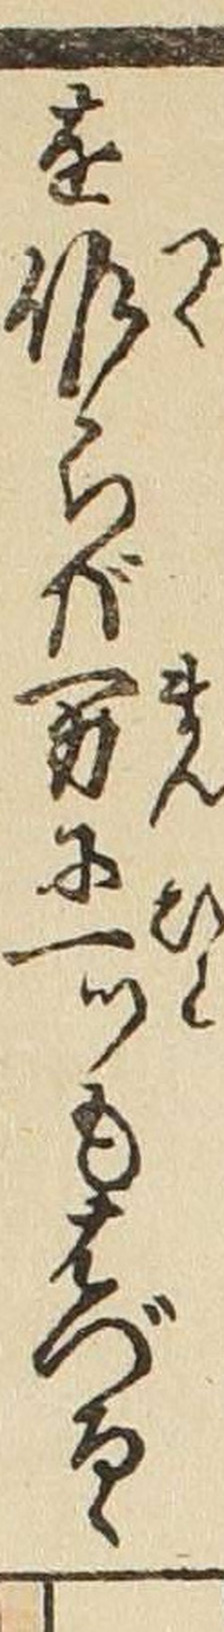を作らば万に一ッもはづるゝ
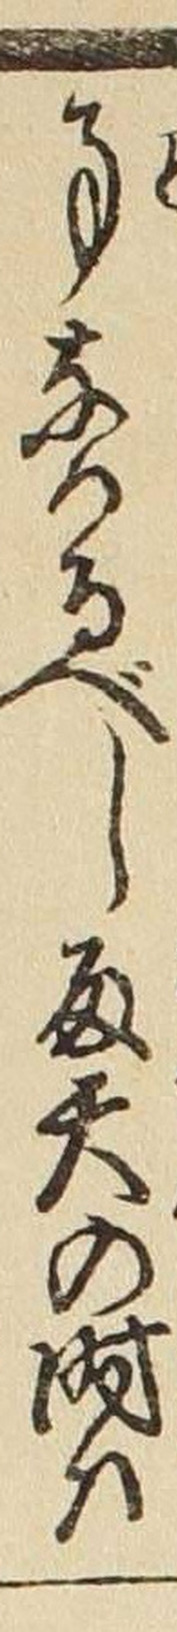事なかるべし雨天の時は
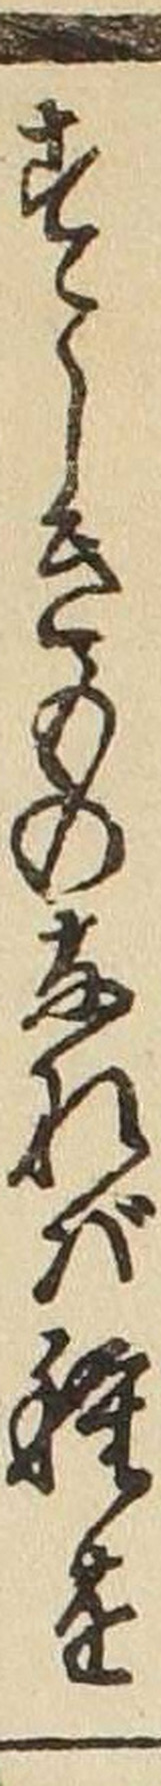すゝしきものなれば種を
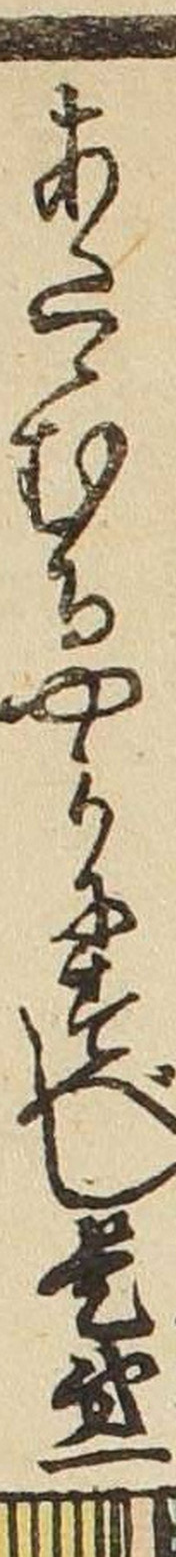あたゝむるやうにすべし是第一
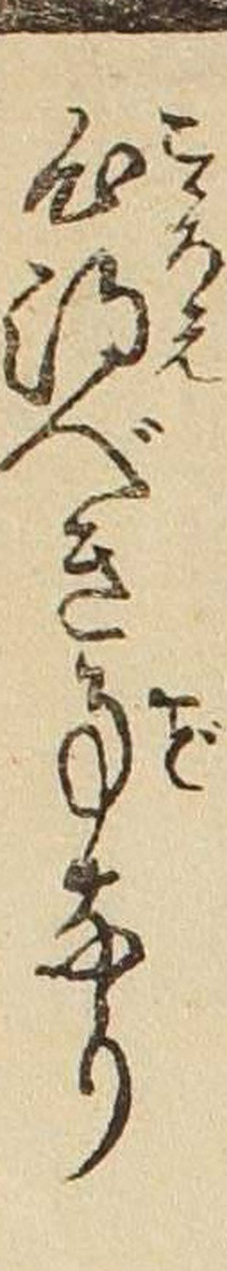心得べき事なり

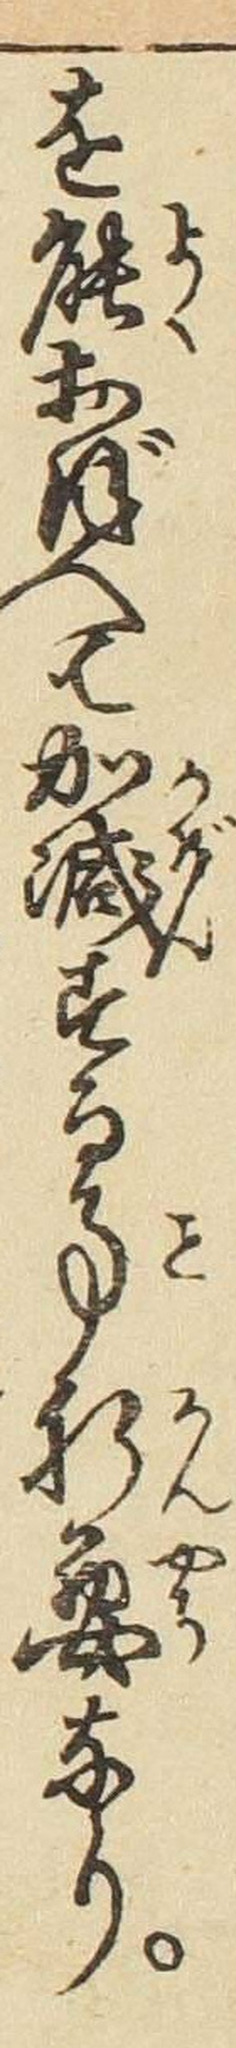を能おぼへて加減する事肝要なり。
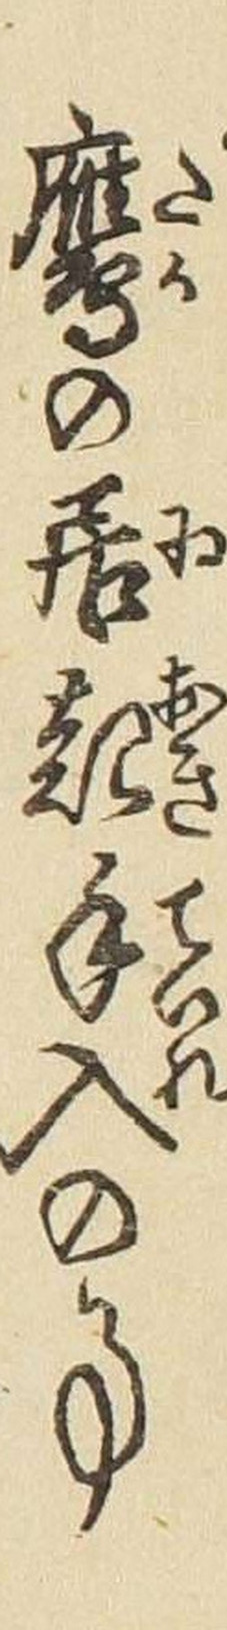鷹の居起手入の事
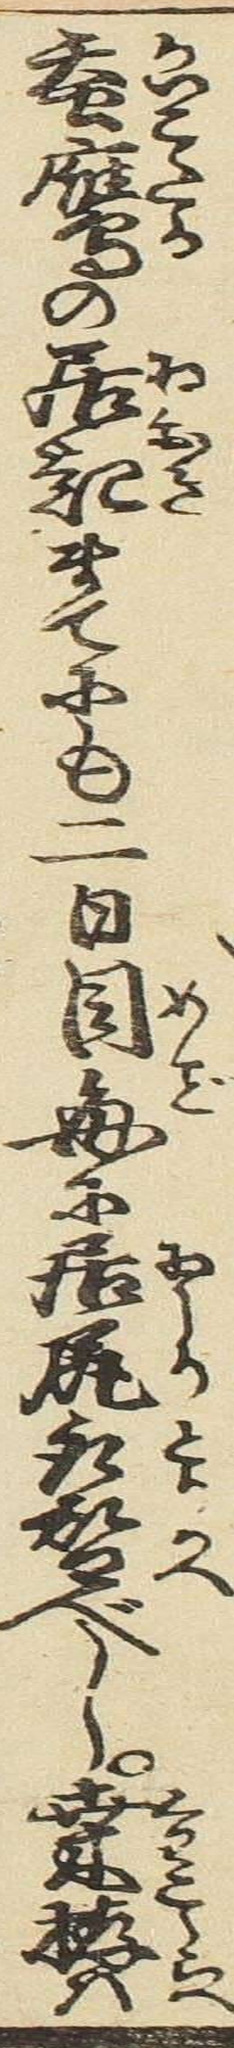蚕鷹の居起まてにも二日目毎に居尻取替べし。桑拵は
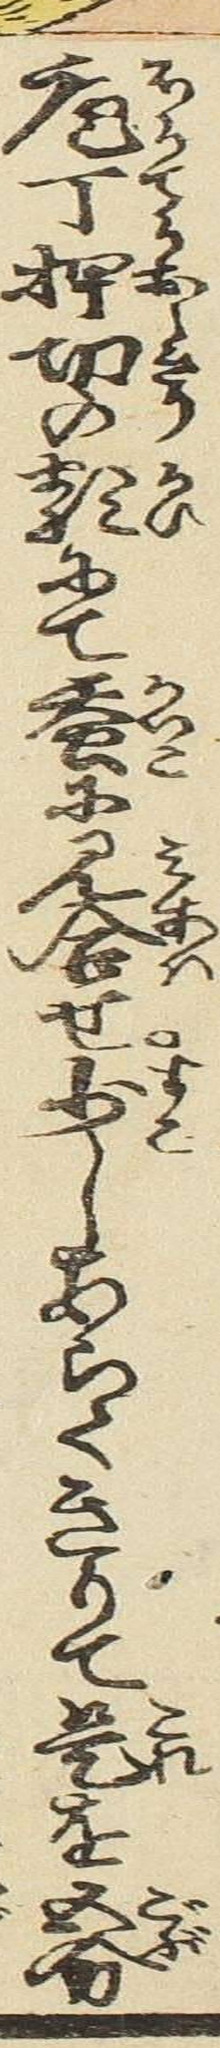庖丁押切の類にて蚕に見合せ。少しあらくきりて是を五分
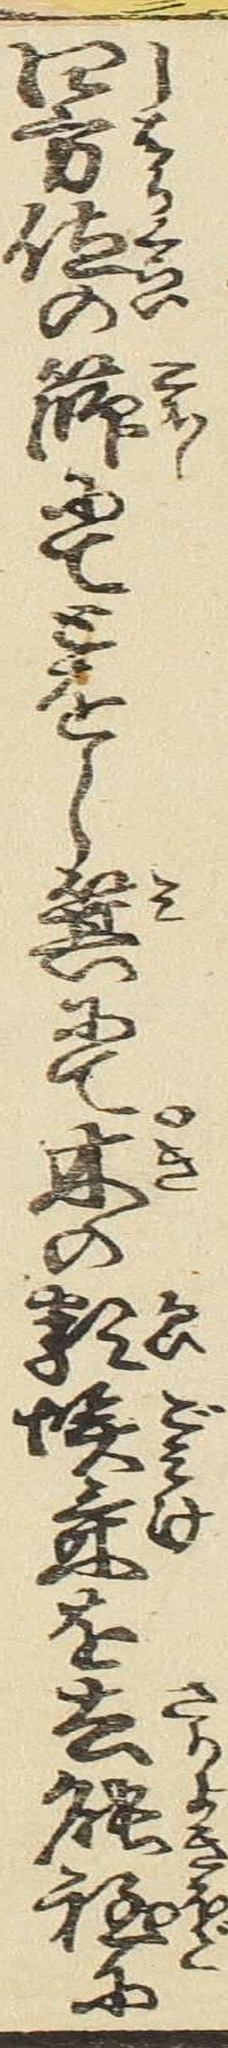四方位の篩にてとをし箕にて。木の類埃気を去能程に
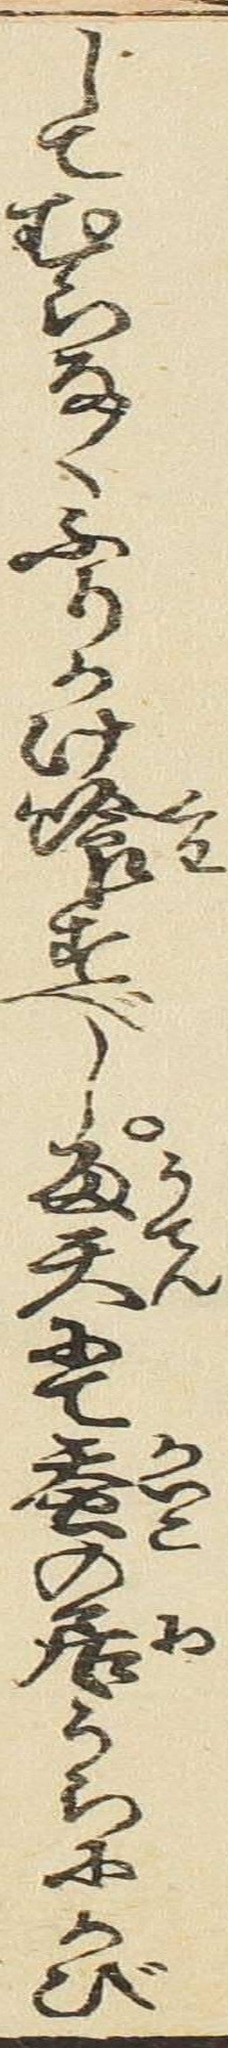してむらなくふりかけ喰すべし。雨天にて蚕の居うらにかび
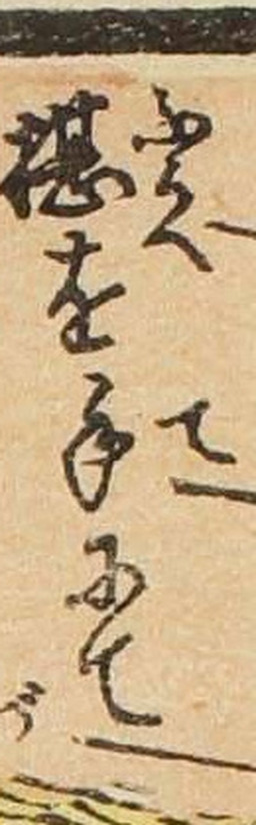椹を手にて
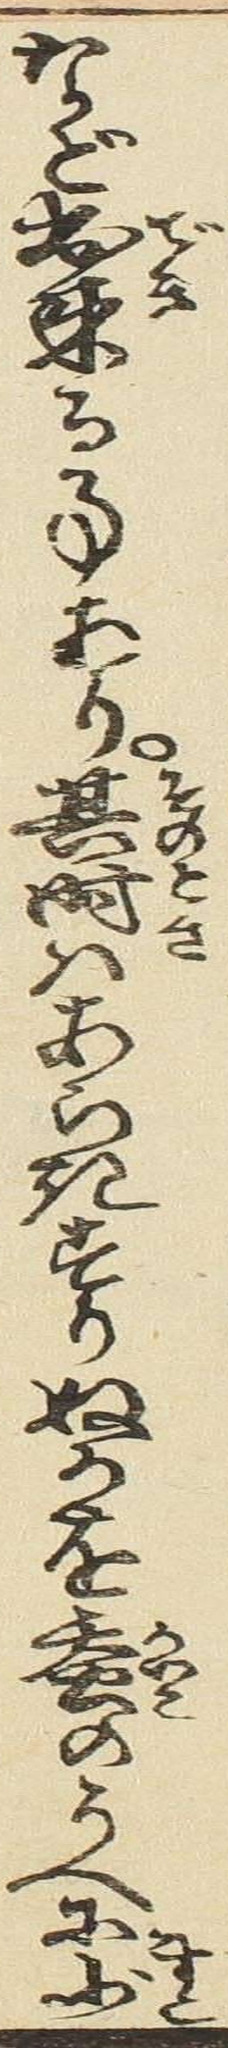など出来る事あり。其時はあらきすりぬかを蚕のうへに少
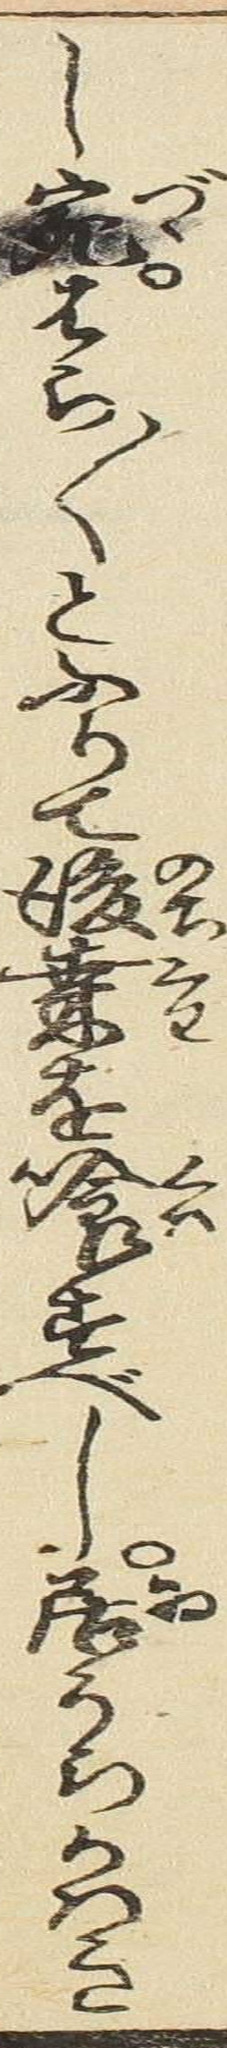し宛。はら〳〵とふりて後桑を喰すべし。居うらかはき
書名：養蠶圖解
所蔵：東京大学農学生命科学図書館 国文学研究資料館
